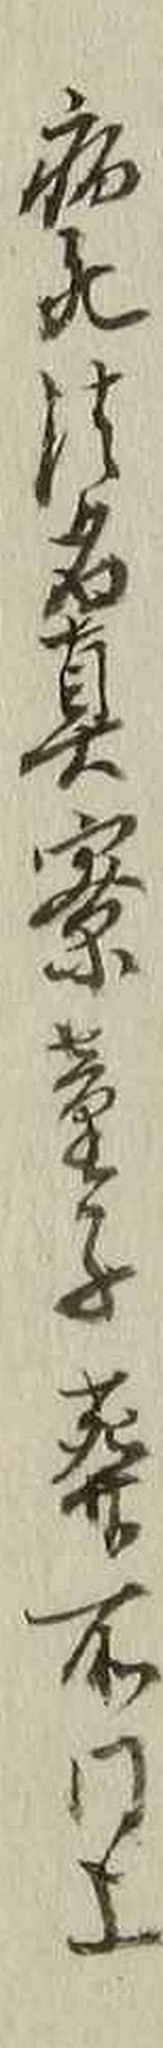病死法名真察童子葬所同上
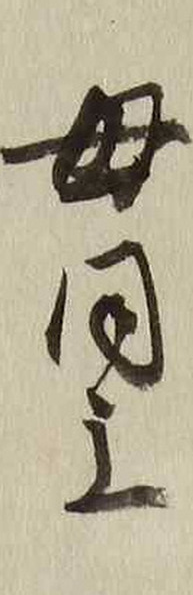母同上
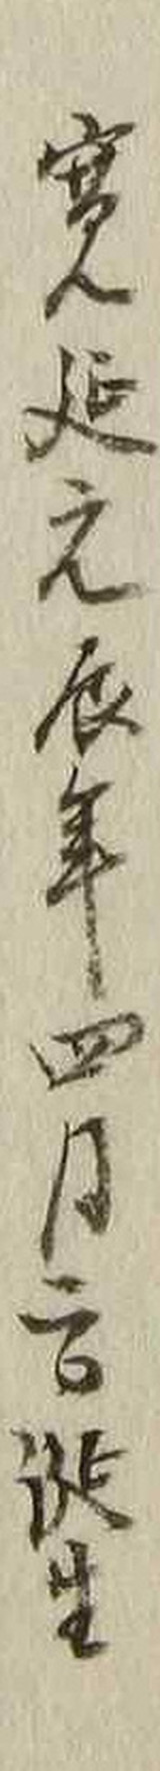寛延元辰年四月二日誕生
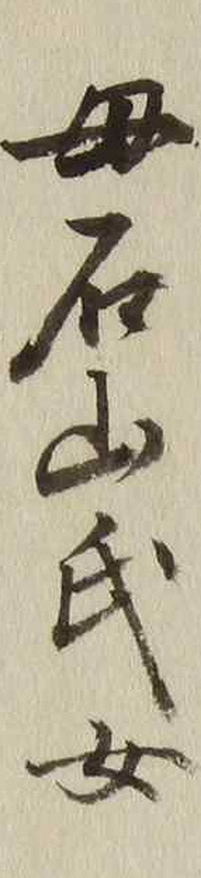母石山氏女
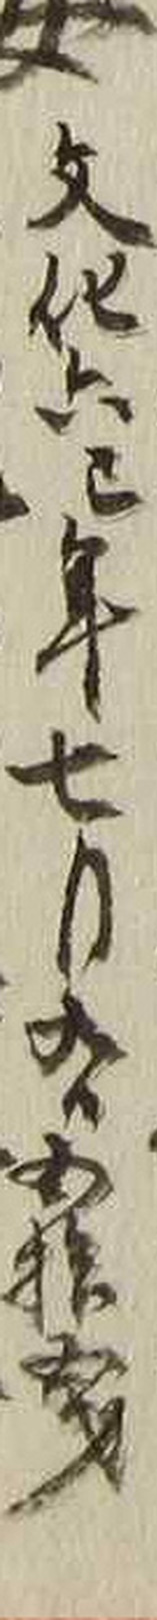文化六巳年七月九日五拾五才
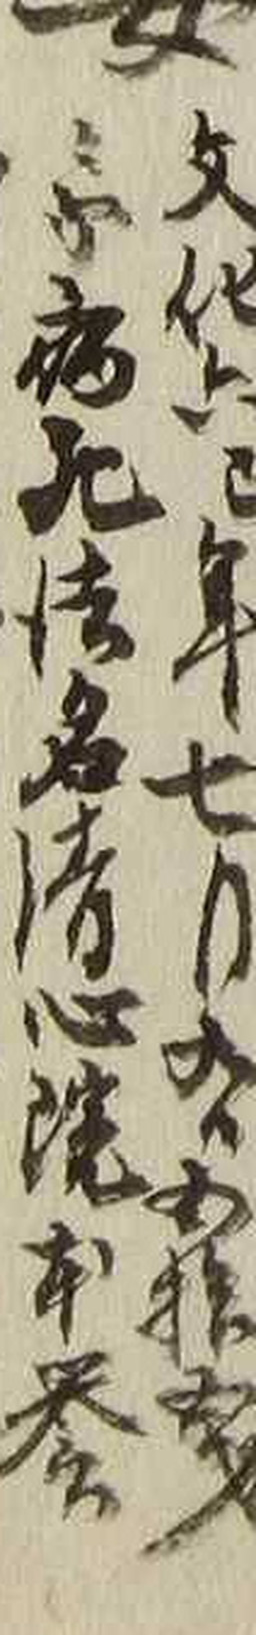ニ而病死法名清心院本誉
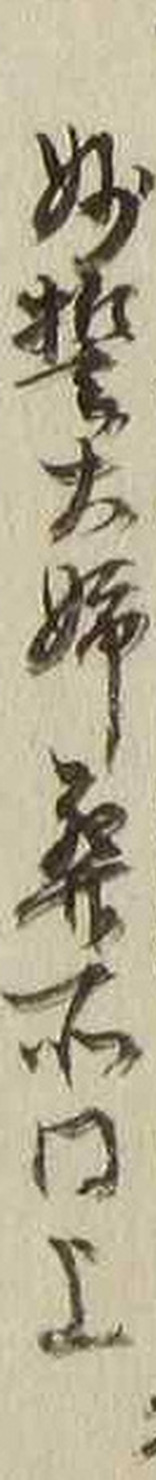妙誓大姉葬所同上
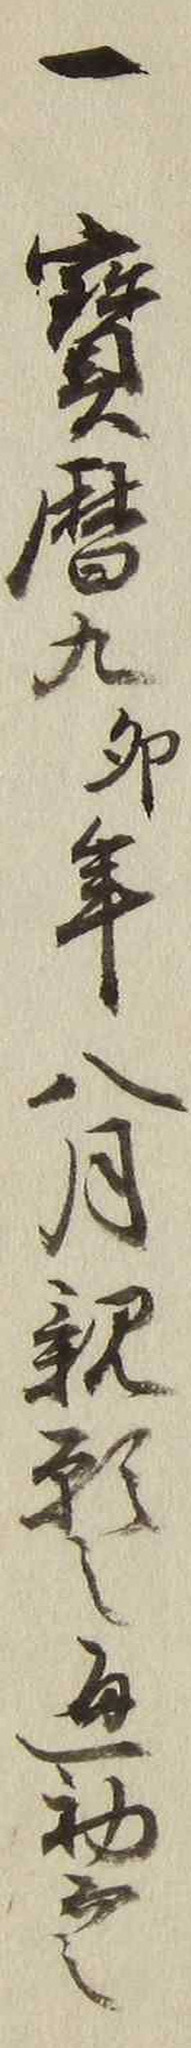一宝暦九卯年八月親願之通初而之
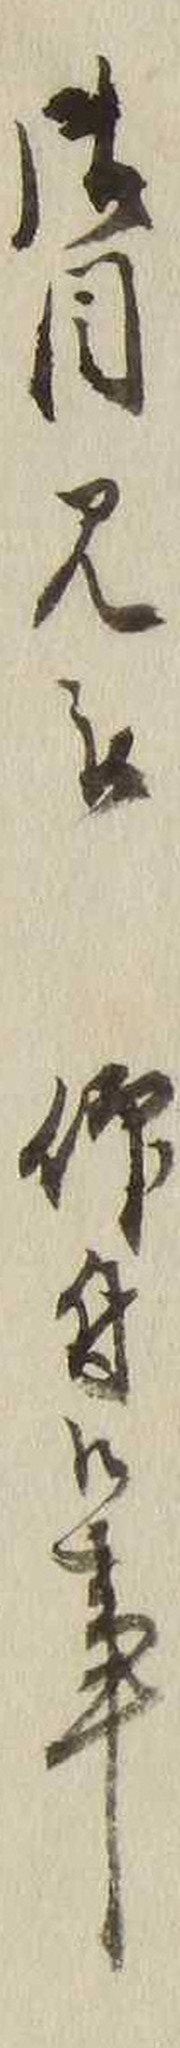御目見被仰付候事

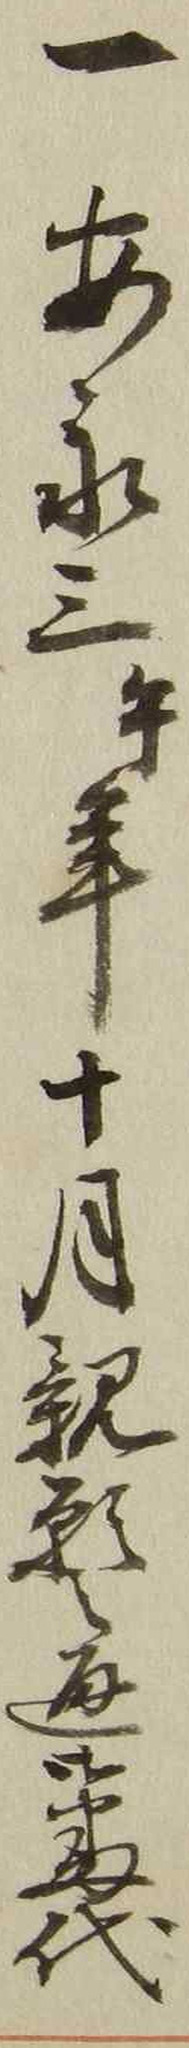一安永三午年十月親願之通御番代
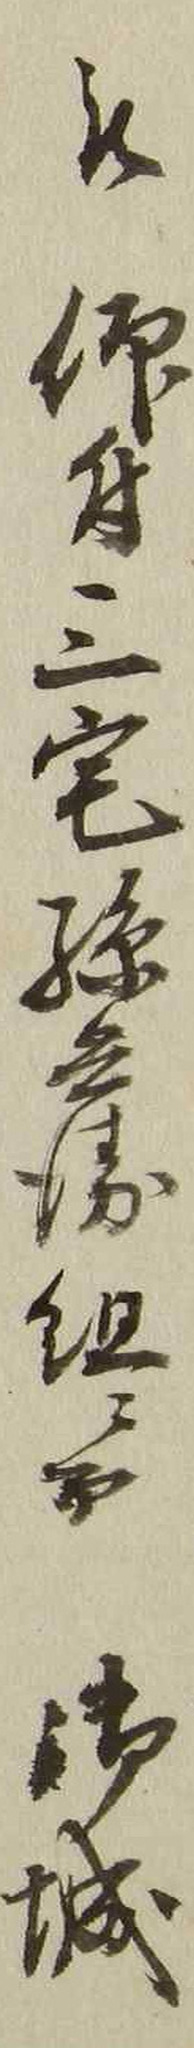被仰付三宅孫兵衛組ニ而御城
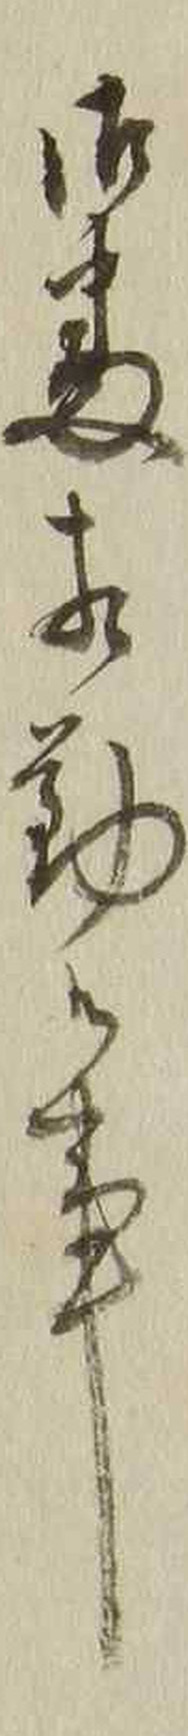御番相勤候事
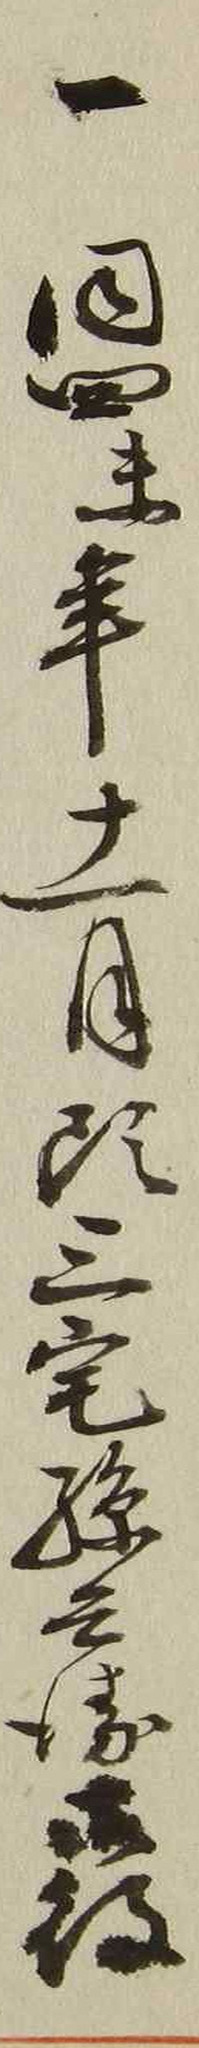一同四未年十一月頭三宅孫兵衛御役
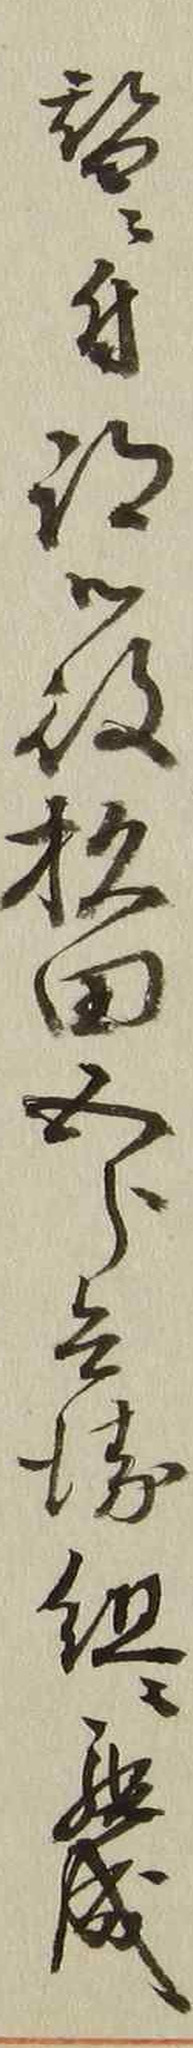替ニ付跡御役杉田五郎兵衛組ニ罷成
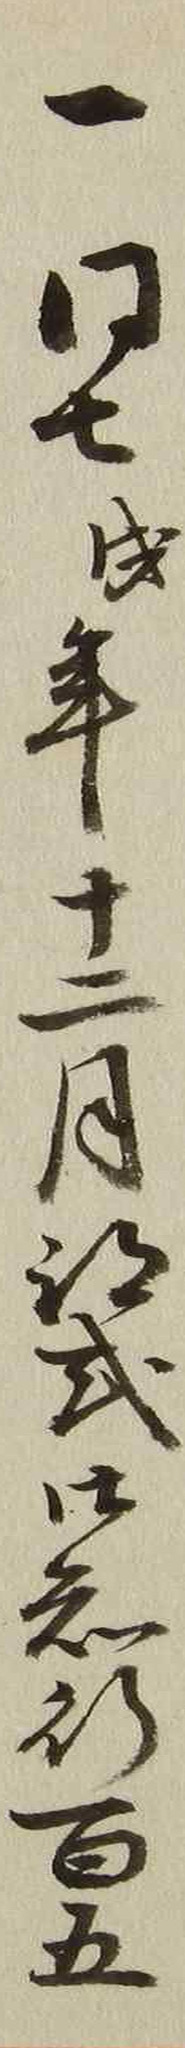一同七戌年十二月跡式御知行百五
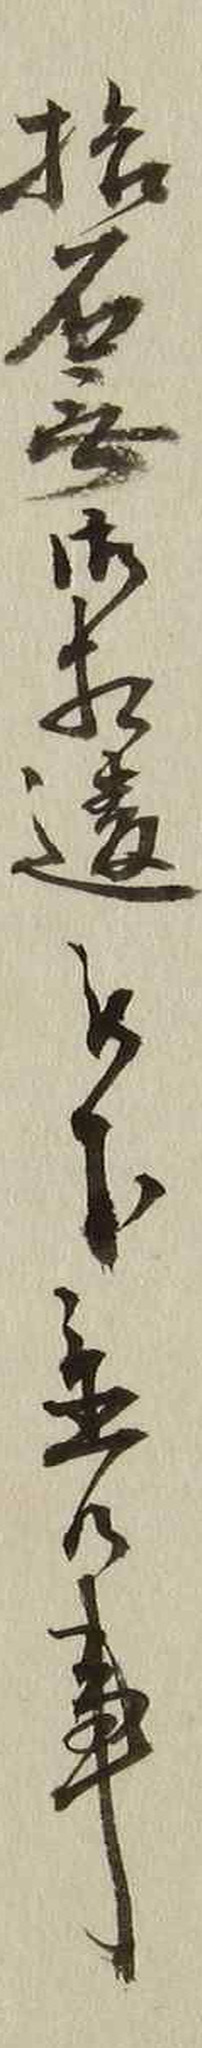拾石無御相違被下置候事
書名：諸士系譜　巻之23　い之部23
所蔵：会津若松市立会津図書館
